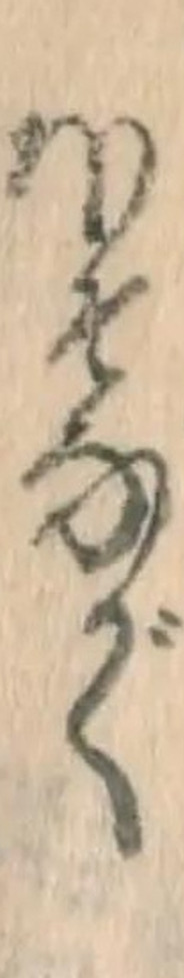ほそながく
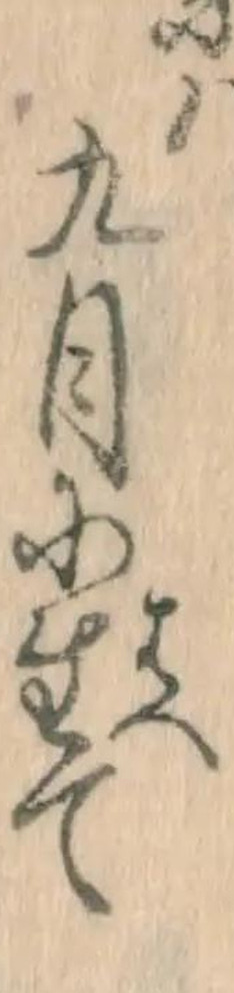九月に生て
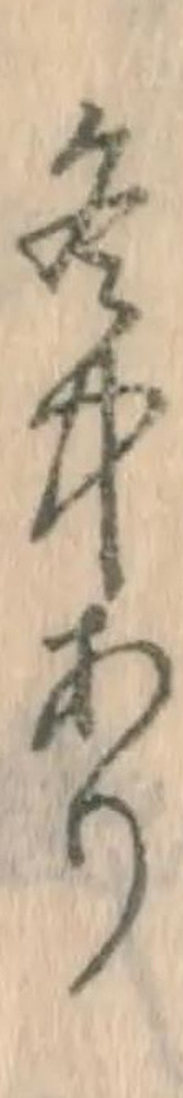冬中あり
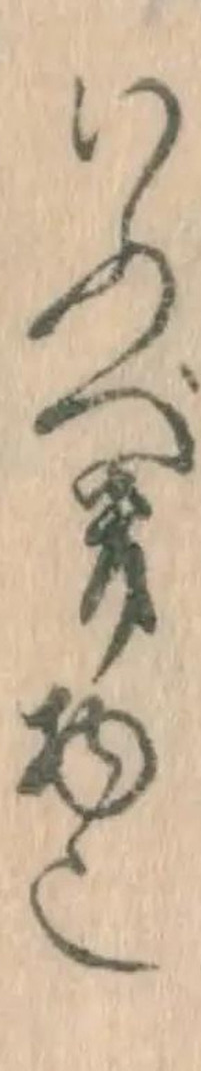いふべき物也
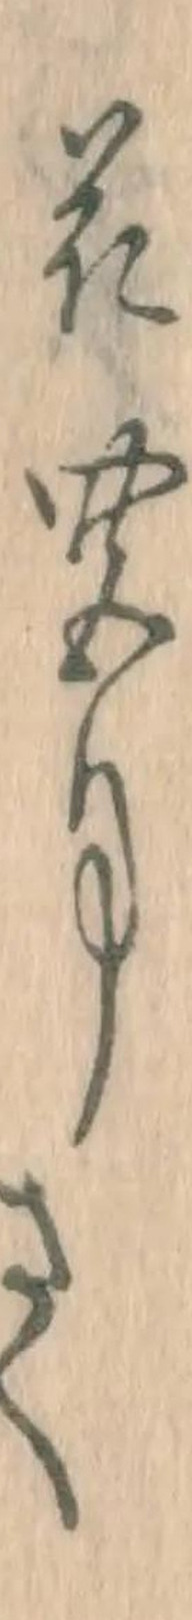花四五月さく
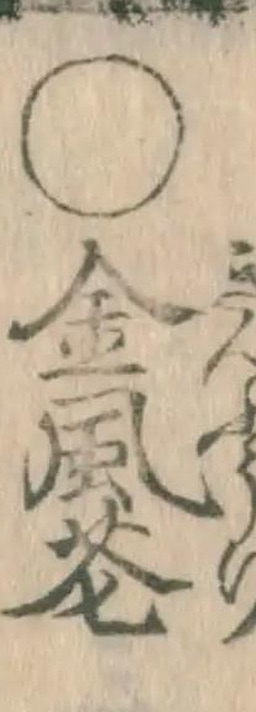〇金風花
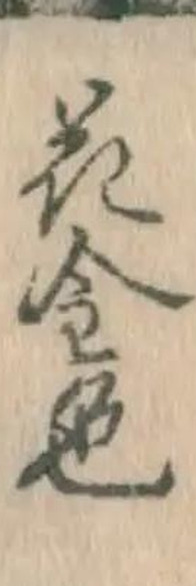花金色
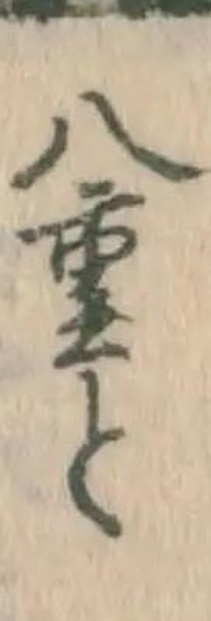八重と
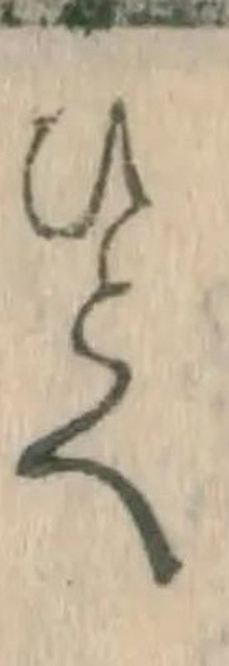ひとへ
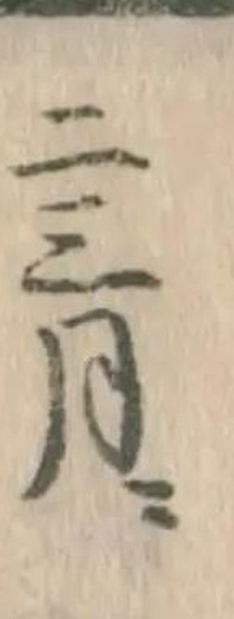二三月に

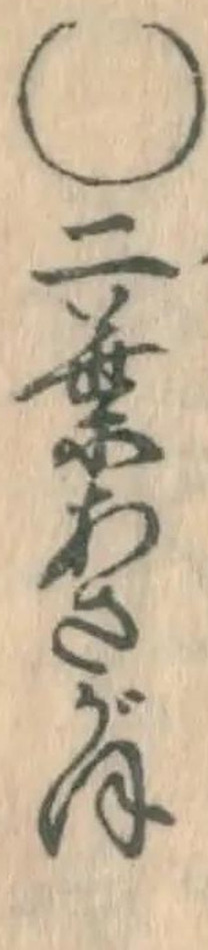〇二葉あさがほ
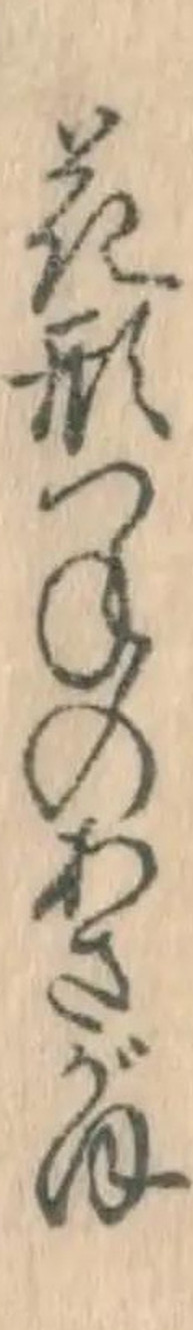花形つねのあさがほ
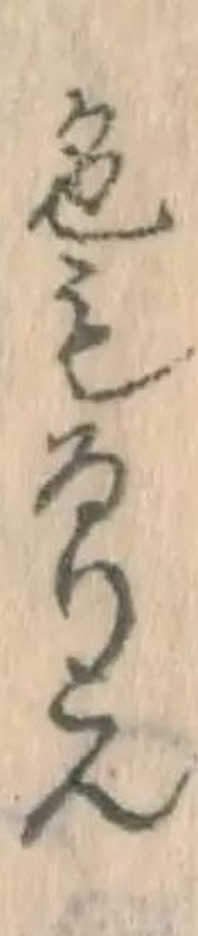色もるりこん
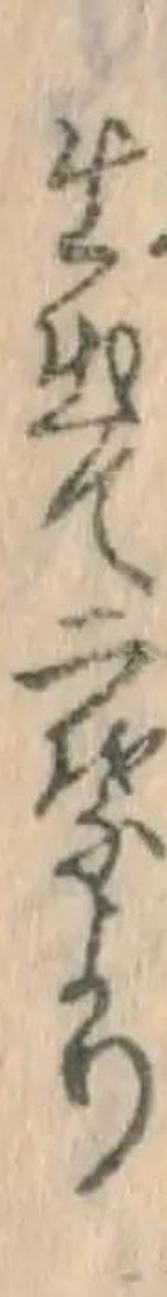生出て二葉より
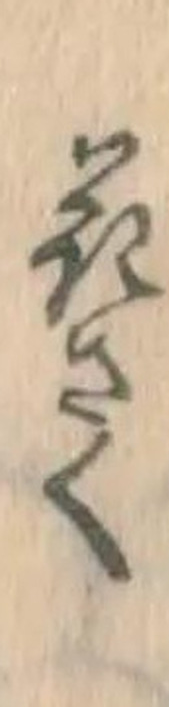花さく
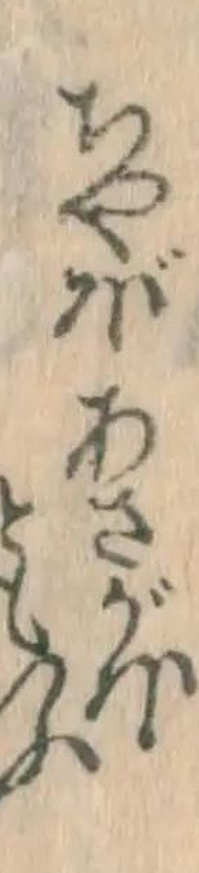ちやぼあさがほ
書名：艸花繪前集. [1]
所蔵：国立国会図書館 National Diet Library, JAPAN
